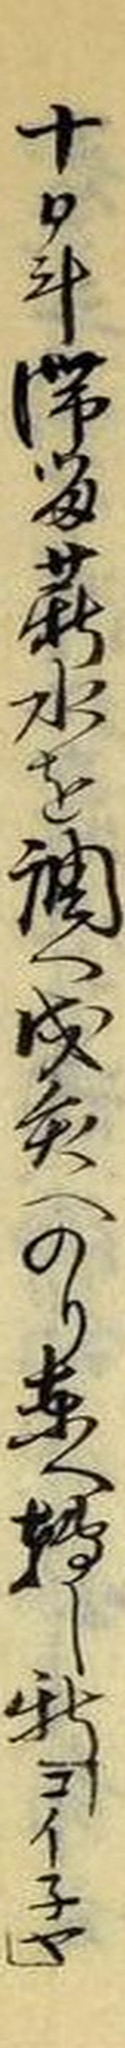十日計滞留薪水を調へ戌亥へのり東へ転し新「コイネヤ」
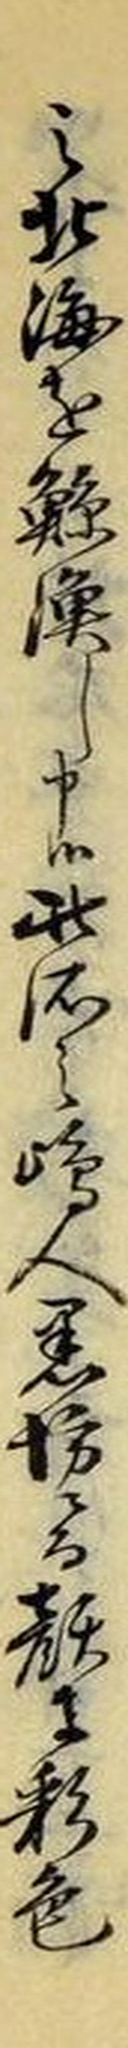之北海を鯨漁し申候此所之嶋人黒坊ニ而顔に彩色
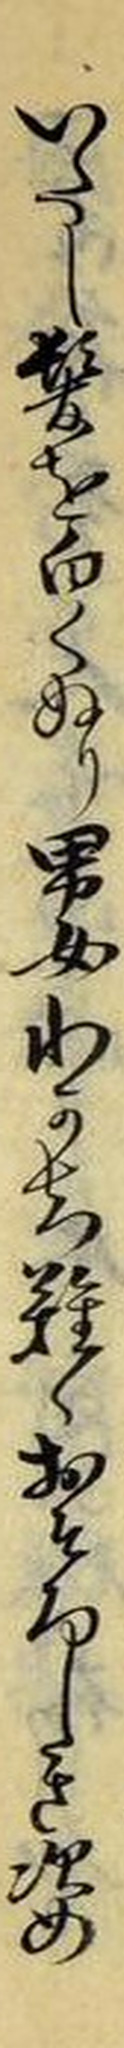いたし髪を白くぬり男女わかち難くおとなしき姿

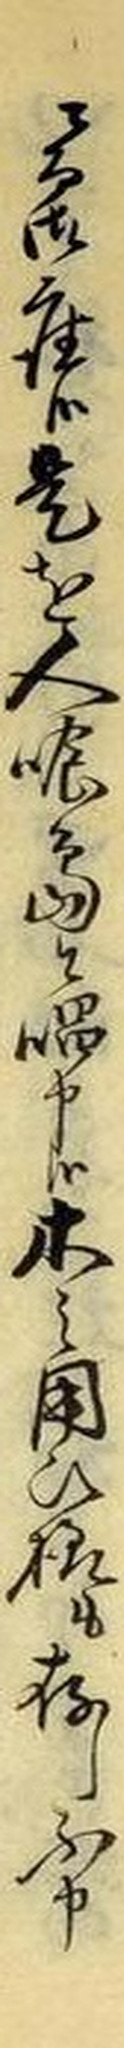ニ而御座候是を人食島と唱申候木之囲ひ様も存し不申
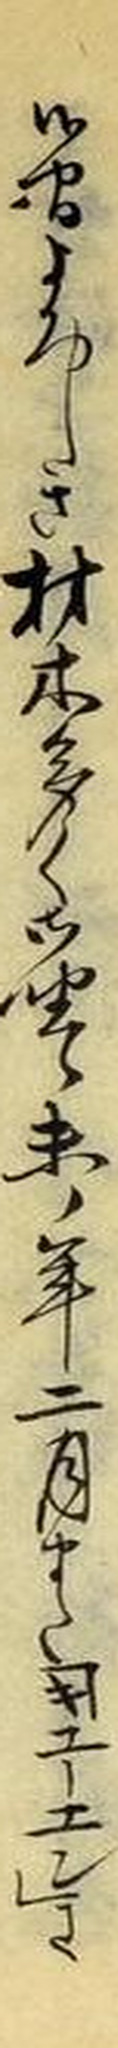候間よろしき材木多く御座候未ノ年二月また「キユーエン」に
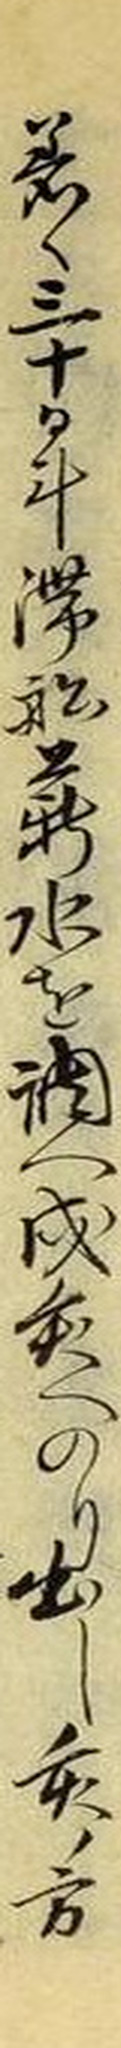着く三十日計滞船薪水を調へ戌亥へのり出し亥ノ方
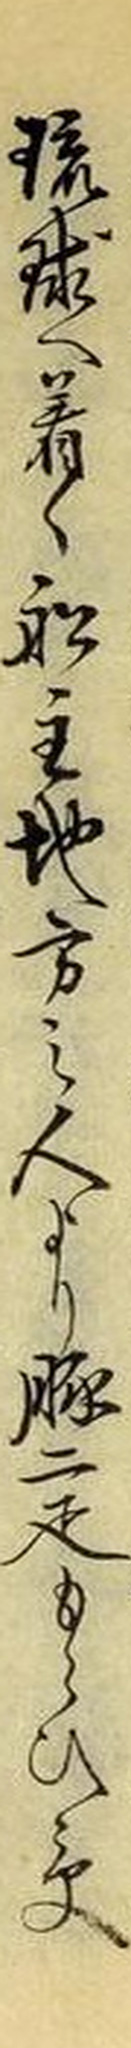琉球へ着く船主地方之人より豚二疋もらひ受
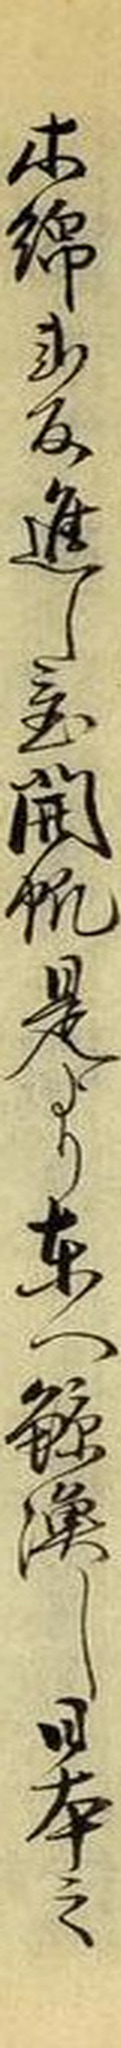木綿弐反進し置開帆是より東へ鯨漁し日本之
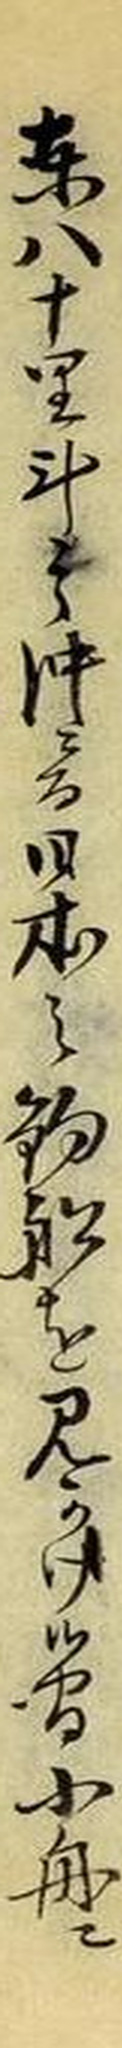東八十里計之沖二而日本之釣船を見かけ候間小舟ニ
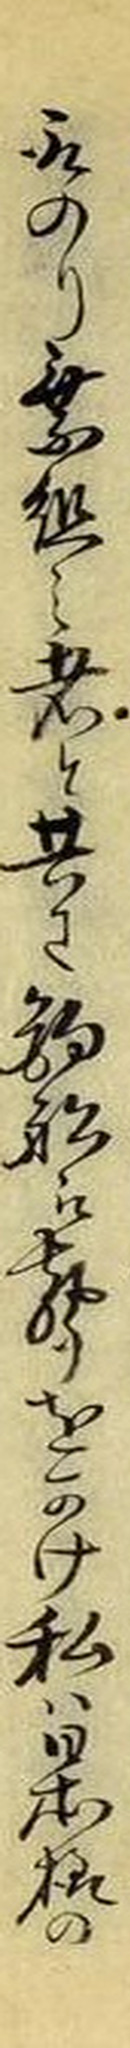取のり乗組之者と共に釣船へ声をかけ私ハ日本様の
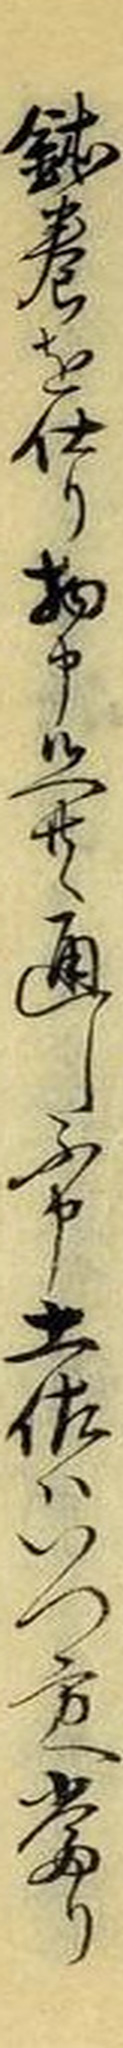鉢巻を仕り物申候へ共通し不申土佐ハいつ方へ当り
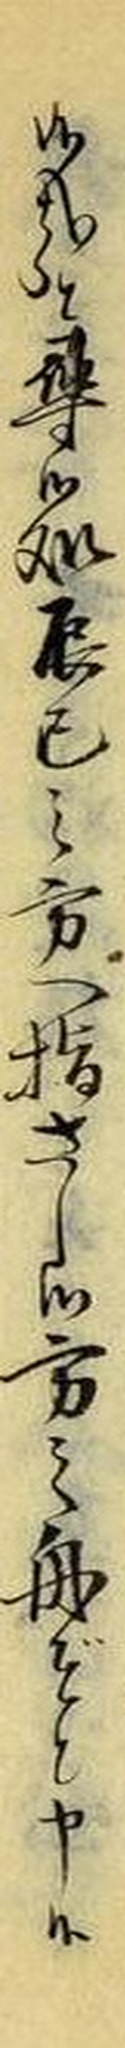候哉と尋候処辰巳之方へ指さし候方之舟ぞと申候
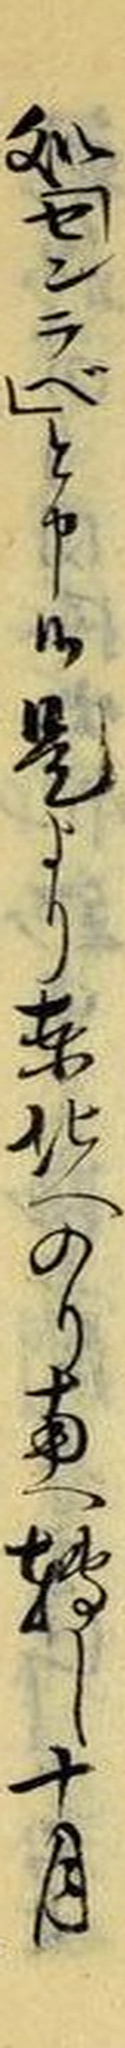処「センラべ」と申候是より東北へのり東へ転し十月
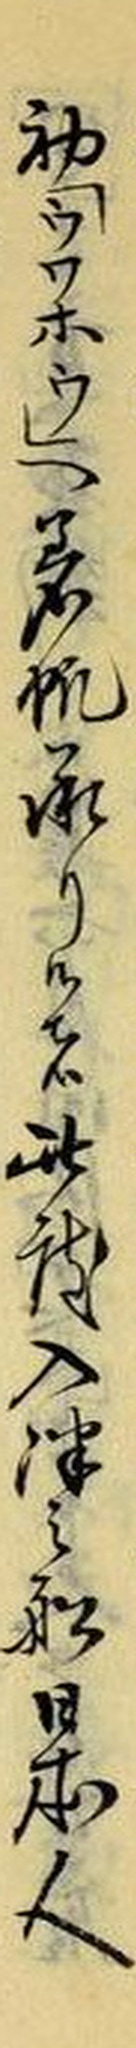初「ウワホウ」へ着帆承り候は此度入洋之船日本人
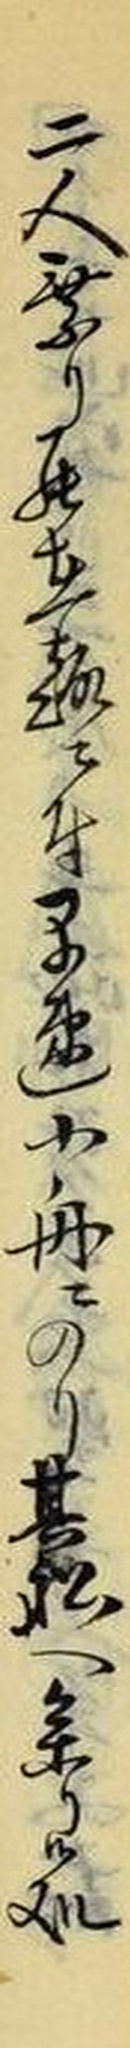二人乗り罷在趣ニ付早速小舟ニのり其船へ参り候処
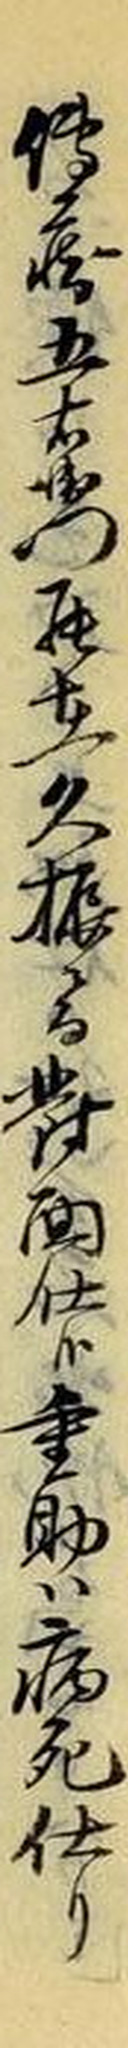傳蔵五右衛門罷在久振ニ而対面仕候重助ハ病死仕り
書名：漂客談奇（備考雑録写8）
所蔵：福井県文書館 Fukui Prefectural Archives
